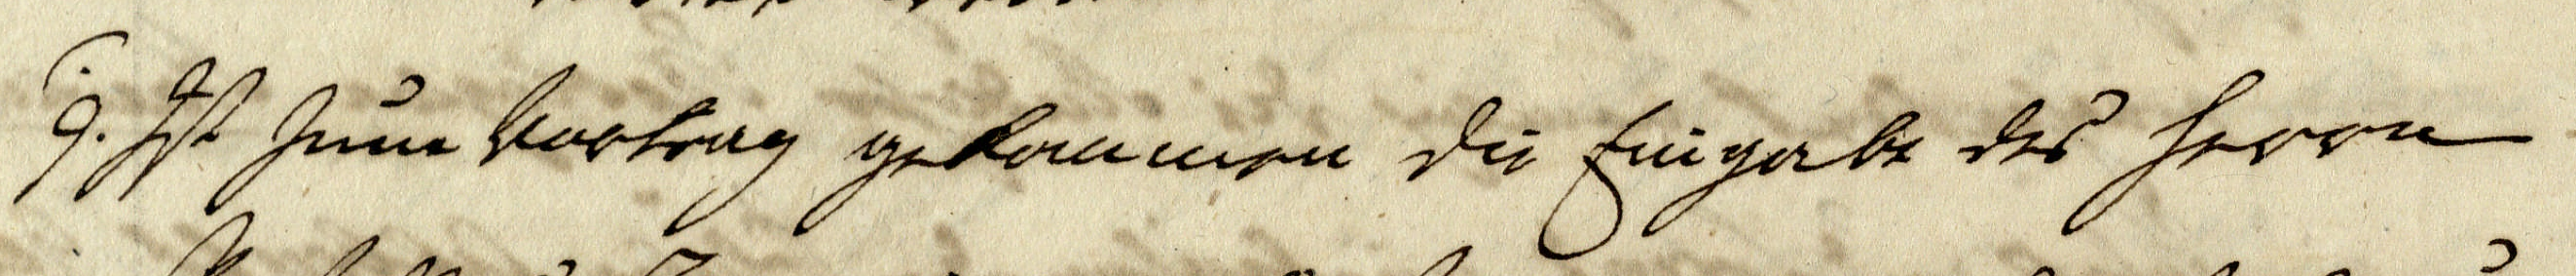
9. Ist zum Vortrag gekommen die Eingabe des Herrn
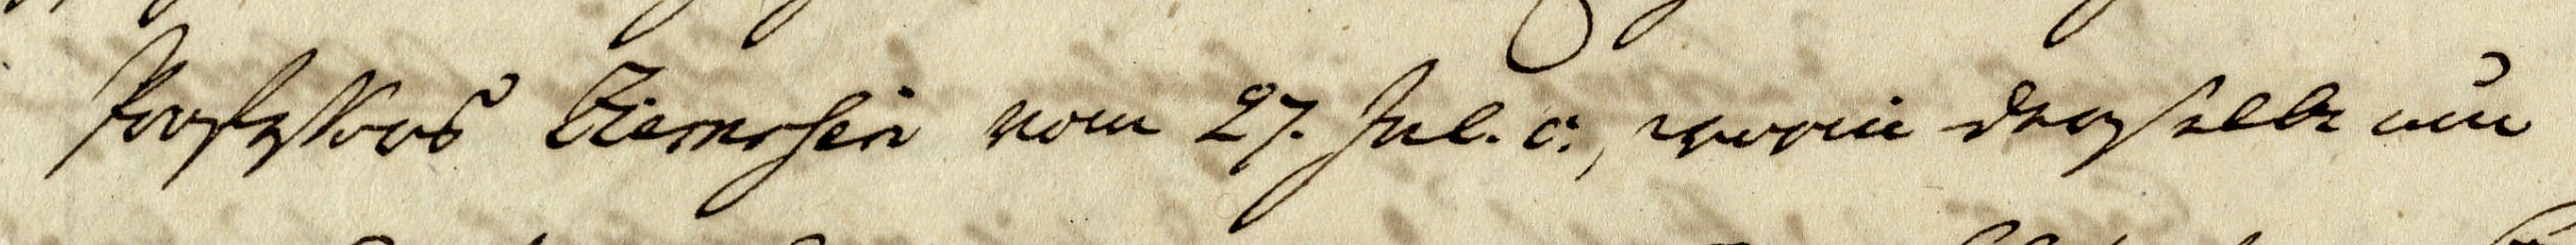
Professors Ziemssen vom 27. Jul. c., worin derselbe um
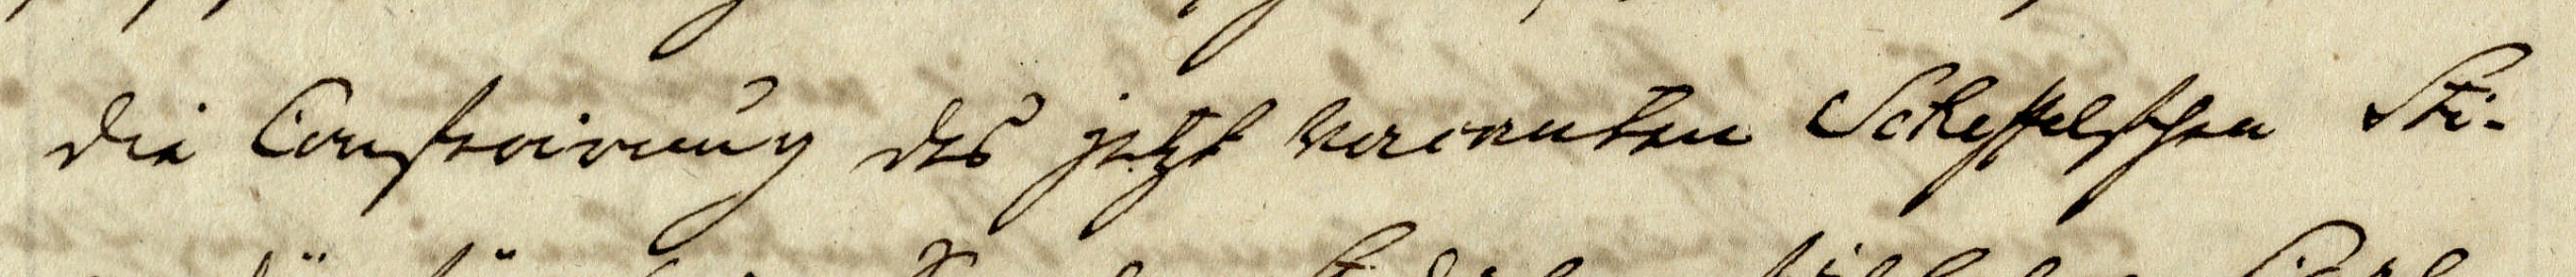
die Conferirung des jetzt vacanten Scheffelschen Sti¬
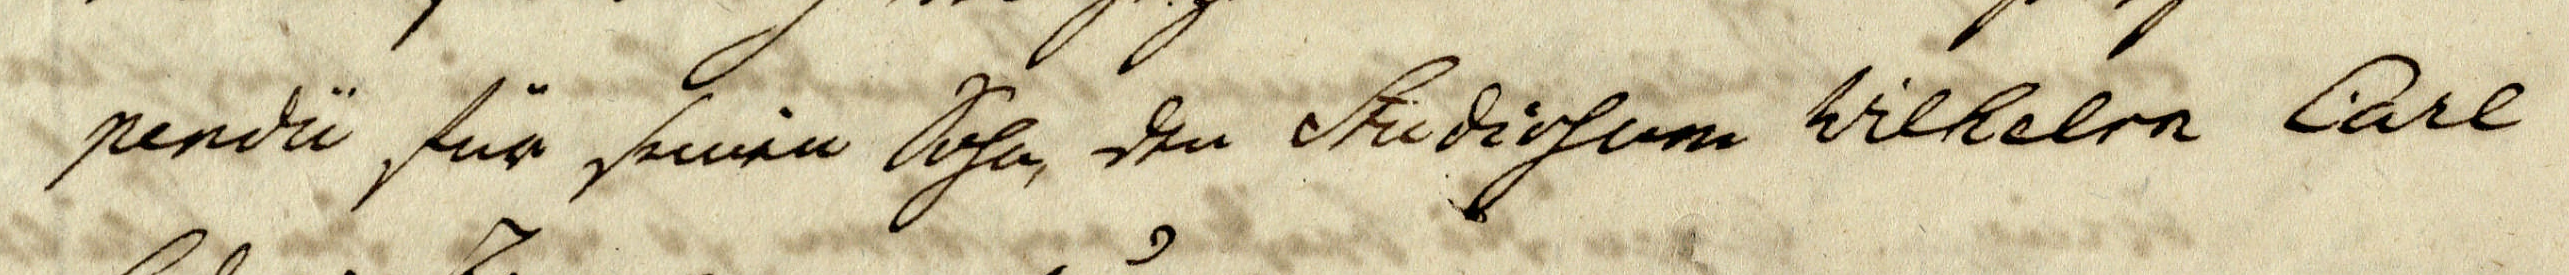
pendii für seinen Sohn, den Studiosum Wilhelm Carl
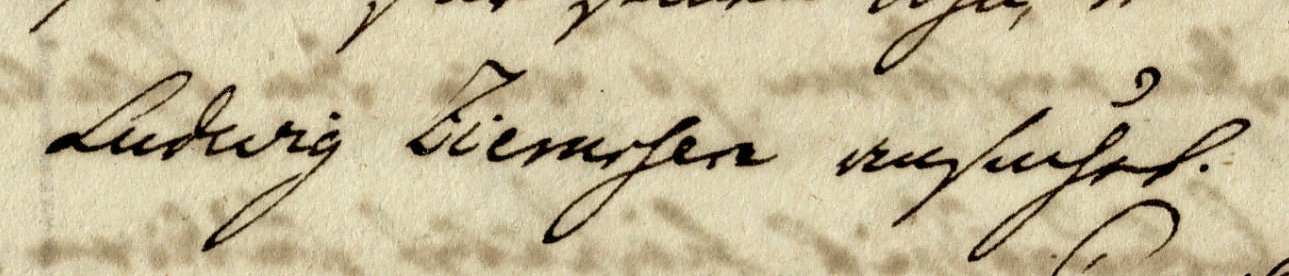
Ludwig Ziemssen ansuchet.
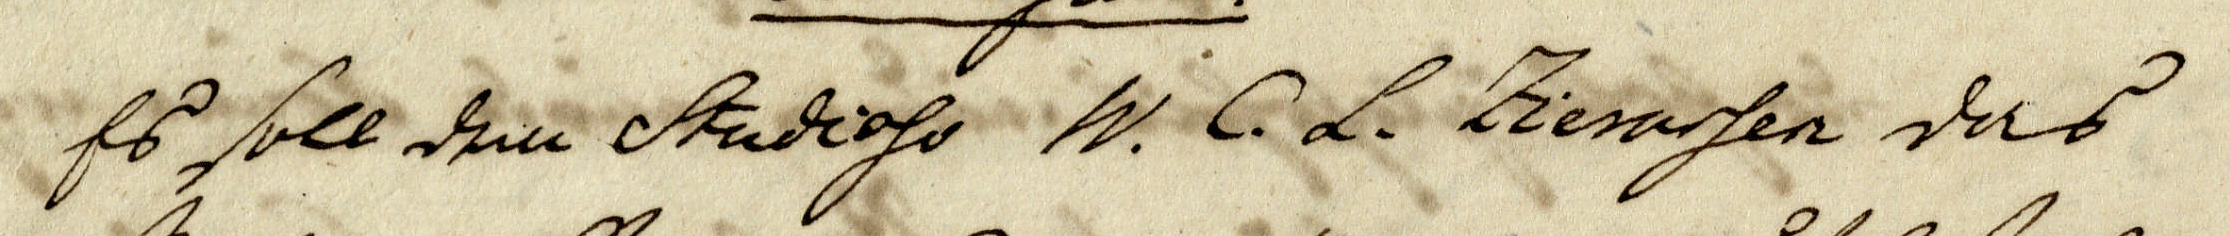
Es soll dem Studioso W. C. L. Ziemssen das
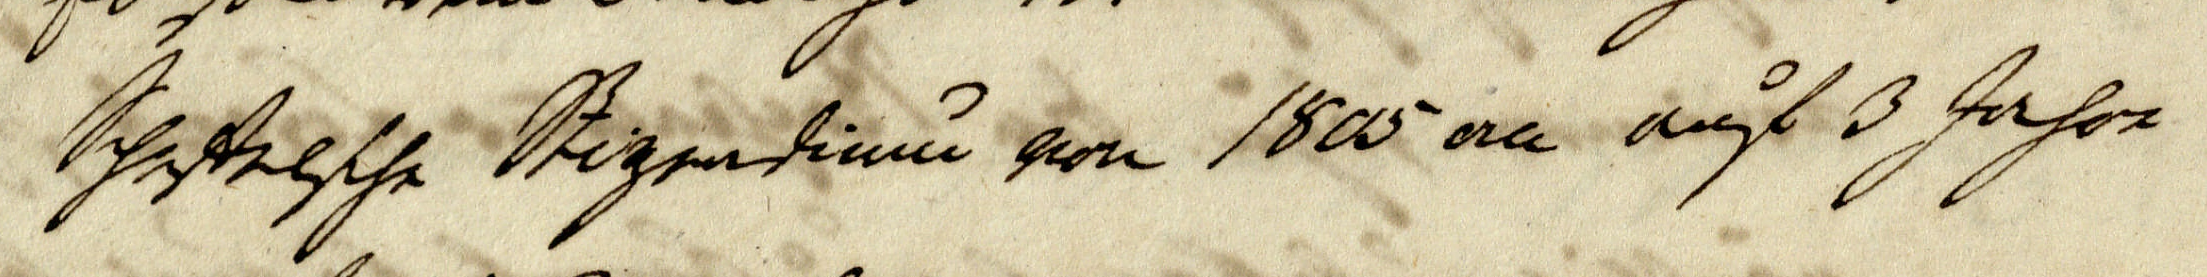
Scheffelsche Stipendium von 1805 an auf 3 Jahre
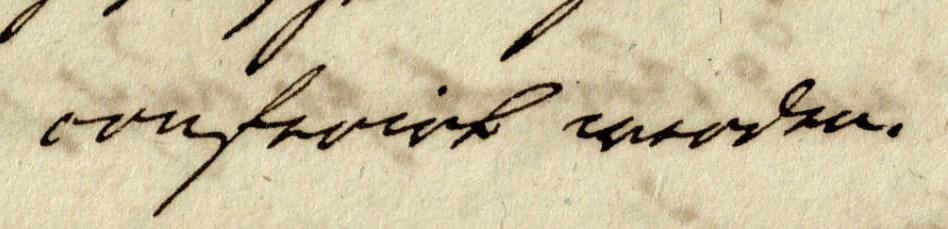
conferirt werden.
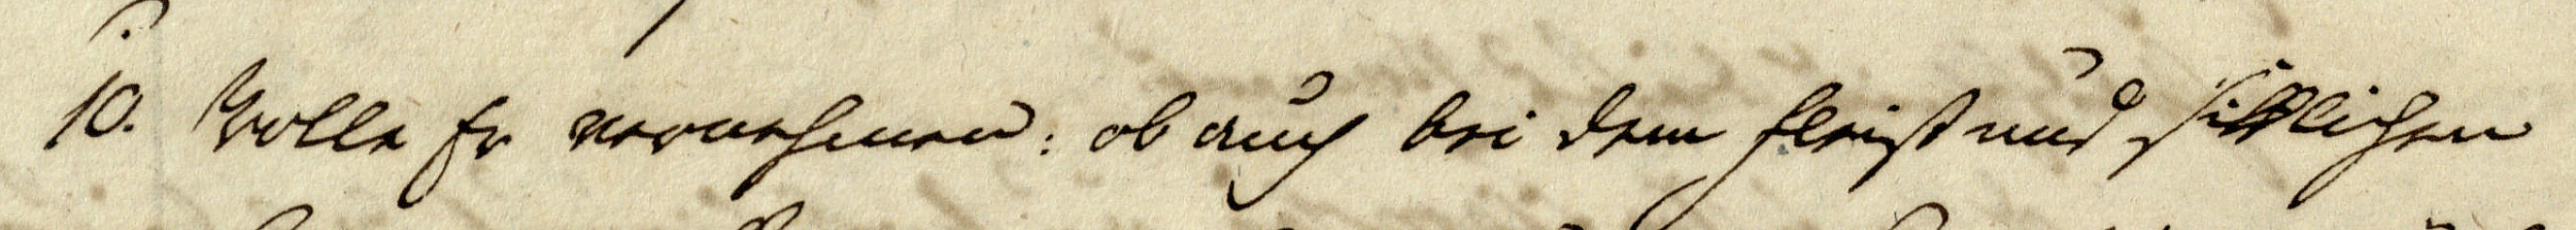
10. Wolle Er vernehmen: ob auch bei dem Fleiß und sittlichen
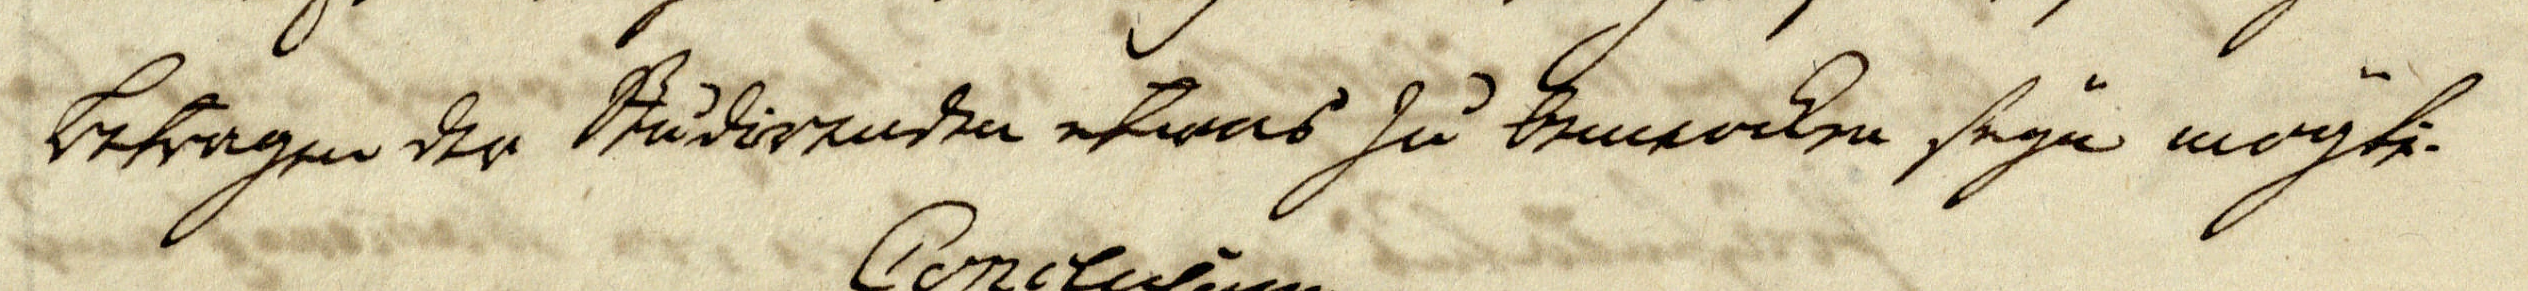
Betragen der Studirenden etwas zu bemercken seÿn mögte.
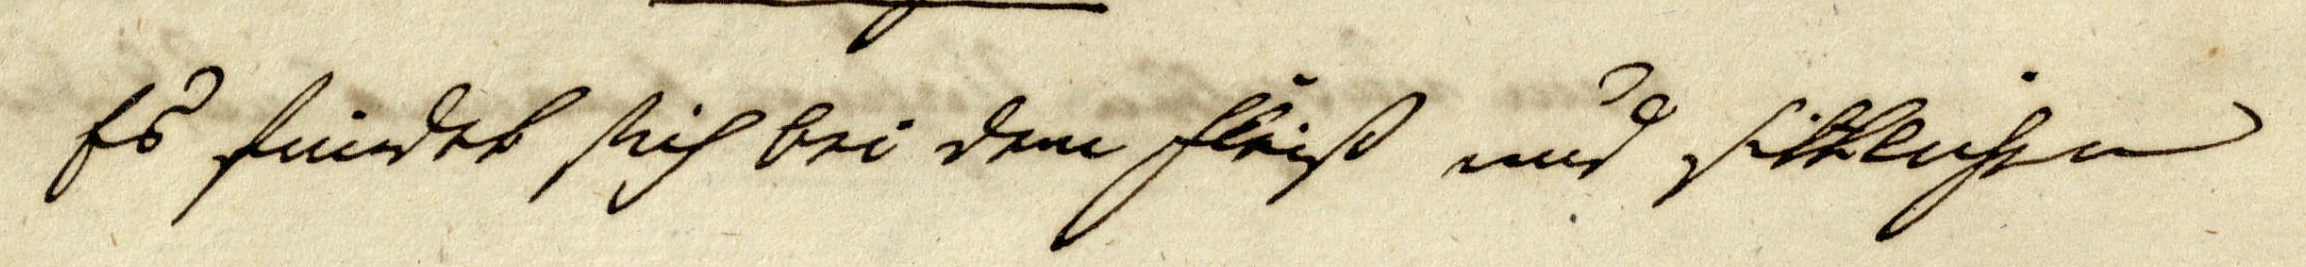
Es findet sich bei dem Fleiß und sittlichen
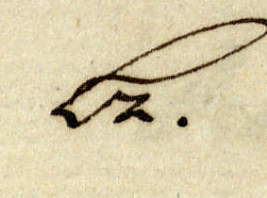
Be¬
